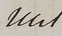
schloss
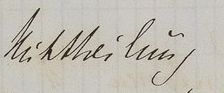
Mittheilung
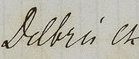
Worten: ‹die
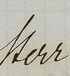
Sache
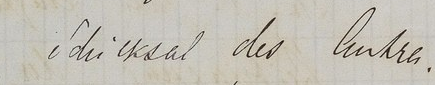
Schicksal des Antra-
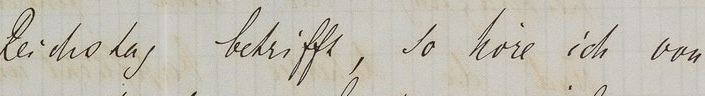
Reichstag betrifft, so höre ich von
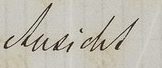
Ansicht
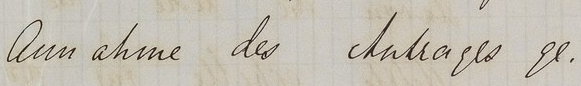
Annahme des Antrages ge-
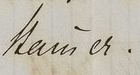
Hammer.
